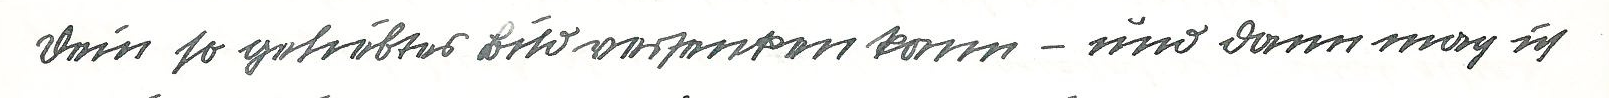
Dein so geliebtes Bild versenken kann – und dann mag ich
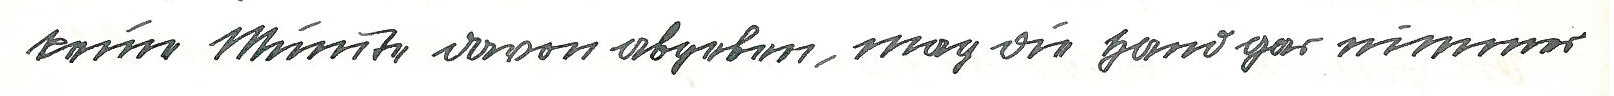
keine Minute davon abgeben, mag die Hand gar nimmer
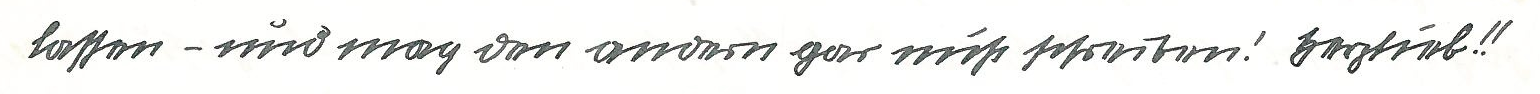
lassen – und mag den andern gar nicht schreiben! Herzlieb!!
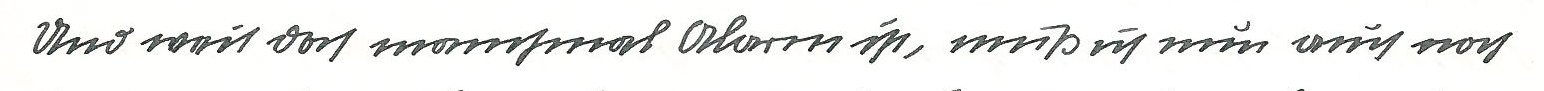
Und weil doch manchmal Alarm ist, muß ich nun auch noch
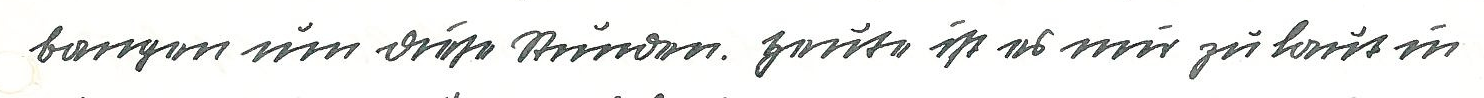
bangen um diese Stunden. Heute ist es mir zu laut in
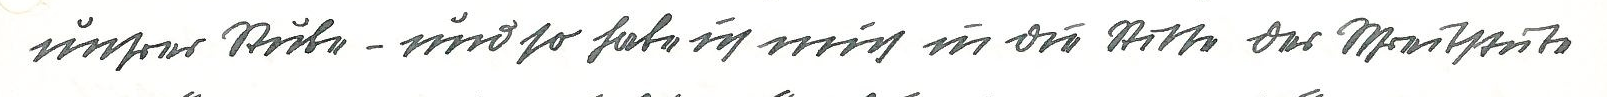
unsrer Stube – und so habe ich mich in die Stille der Schreibstube
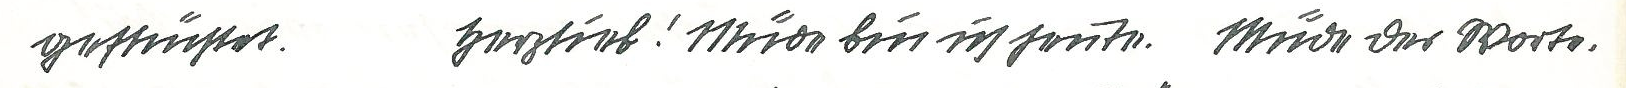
geflüchtet. Herzlieb! Müde bin ich heute. Müde der Worte.
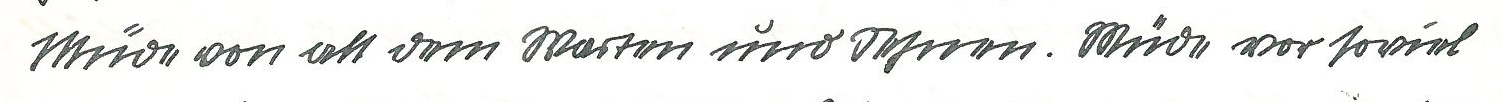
Müde von all dem Warten und Sehnen. Müde vor soviel
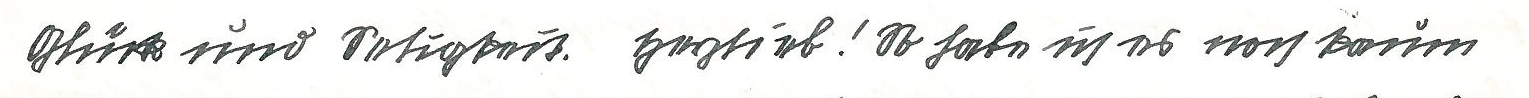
Glück und Seligkeit. Herzlieb! So habe ich es noch kaum
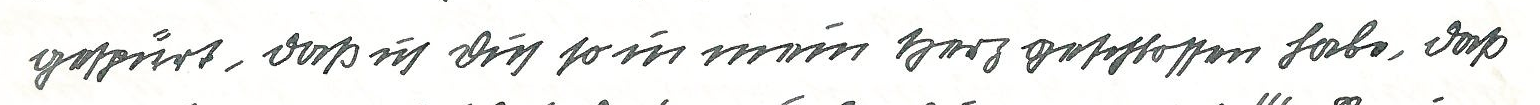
gespürt, daß ich Dich so in mein Herz geschlossen habe, daß
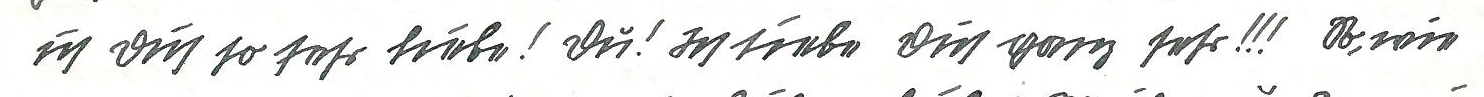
ich Dich so sehr liebe! Du! Ich liebe Dich ganz sehr!!! So, wie
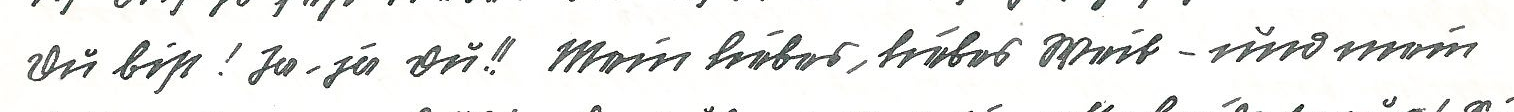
Du bist! Ja, ja Du!! Mein liebes, liebes Weib – und mein
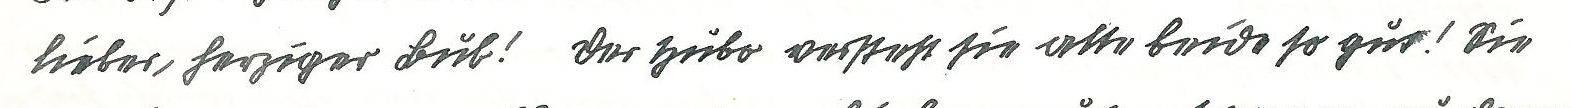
lieber, herziger Bub! Der Hubo versteht sie alle beide so gut! Sie
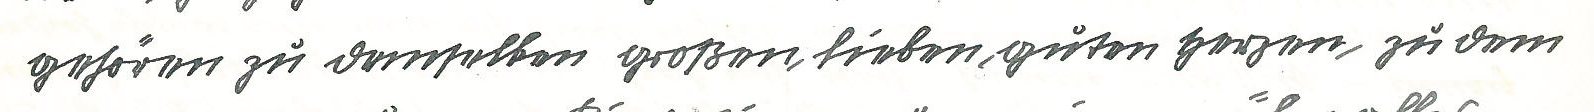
gehören zu demselben großen, lieben, guten Herzen, zu dem
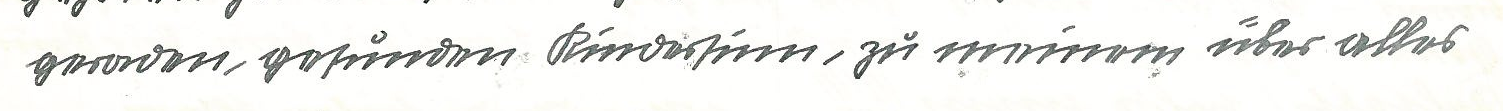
geraden, gesunden Kindersinn, zu meinem über alles
